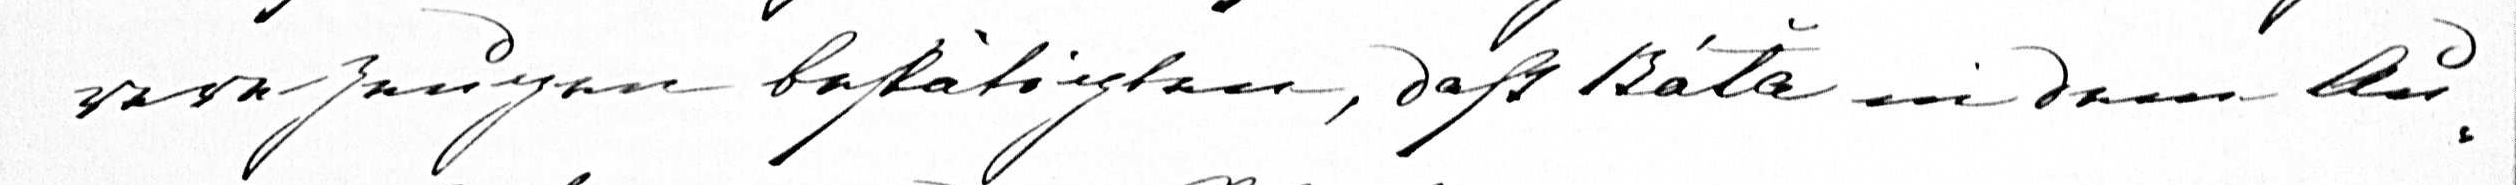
rere Zeuge bestätigten, daß Báta in dem Au¬
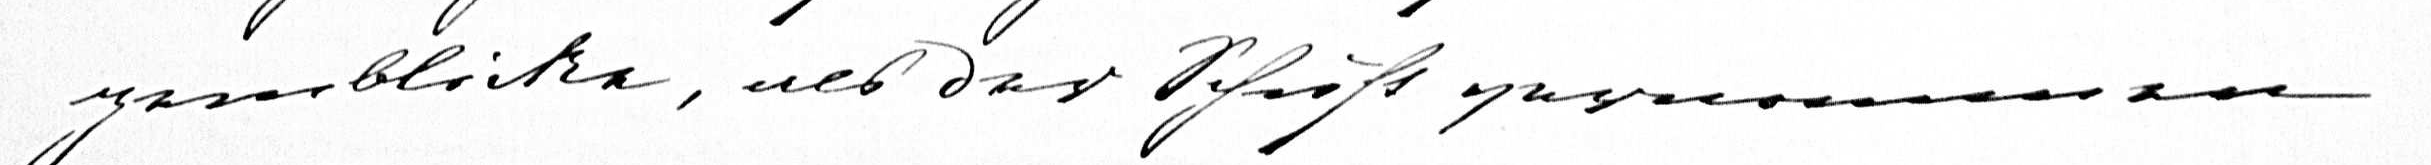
gen blicke, als der Schuß vernommen
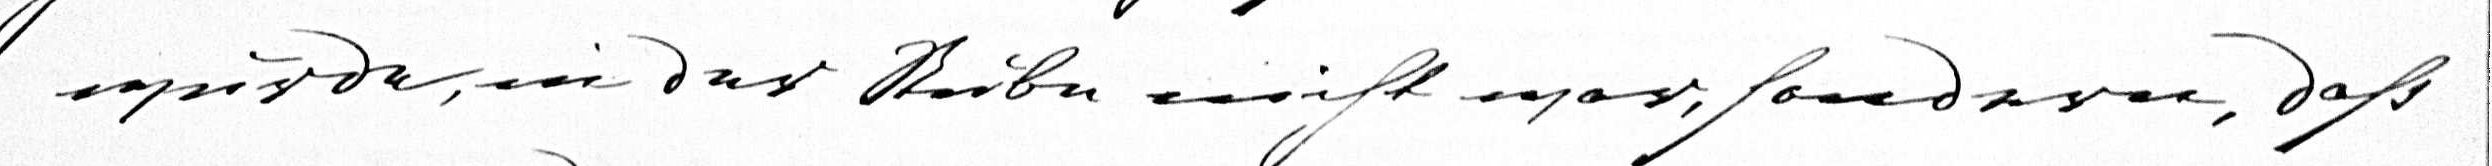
wurde, in der Stube nicht war, sondern, daß
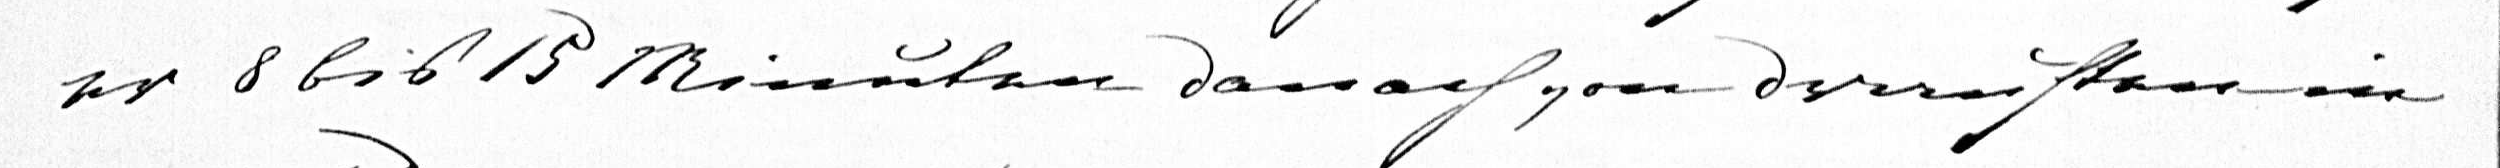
er 8 bis 15 Minuten danach von Drauften in
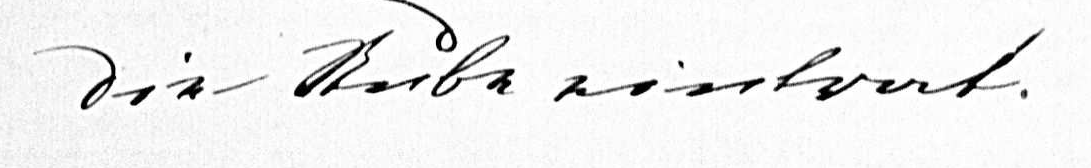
die Stube eintrat.
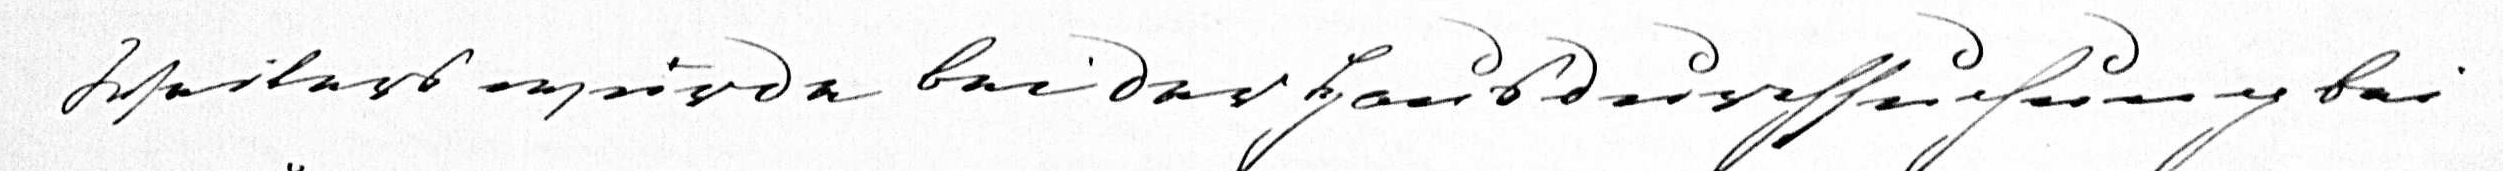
Weiters wurde bei der Hausdurchsuchung bei
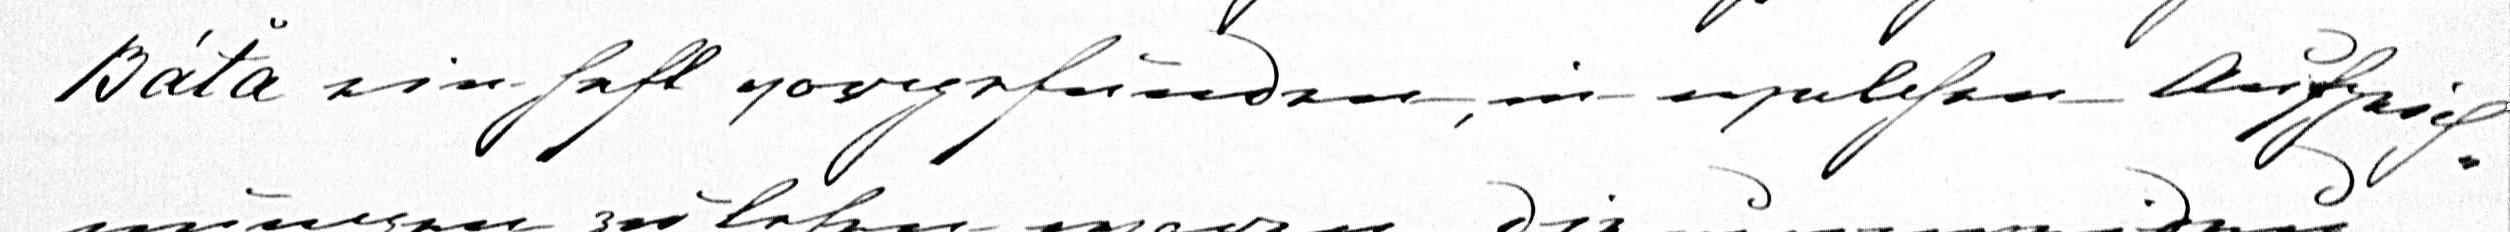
Báta ein heft vorgefunden, in welchen Aufzeich¬
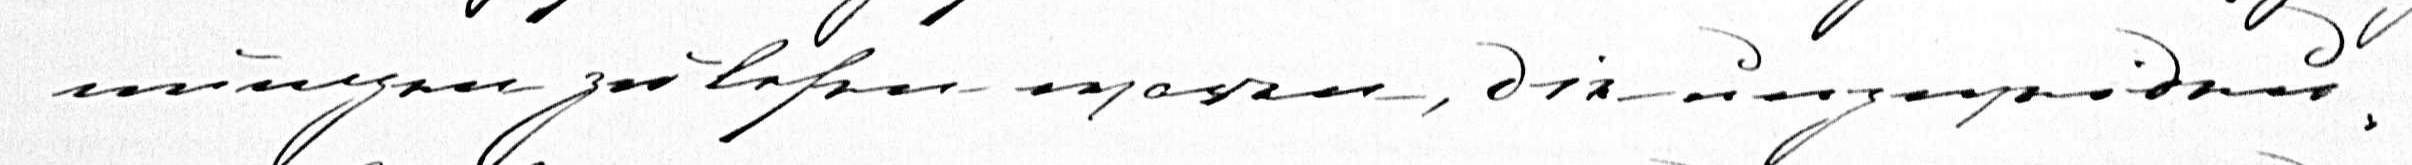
nungen zu lesen waren, die unzweideu¬
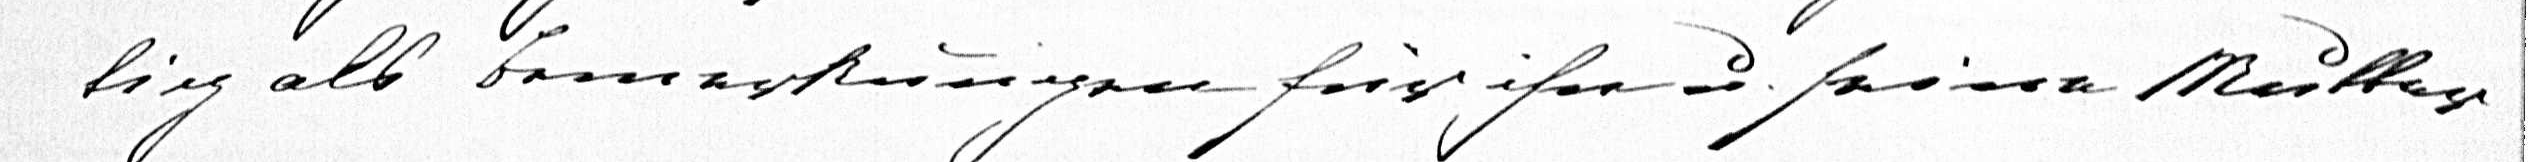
tig als Bemerkungen für ihre u. seine Mutter
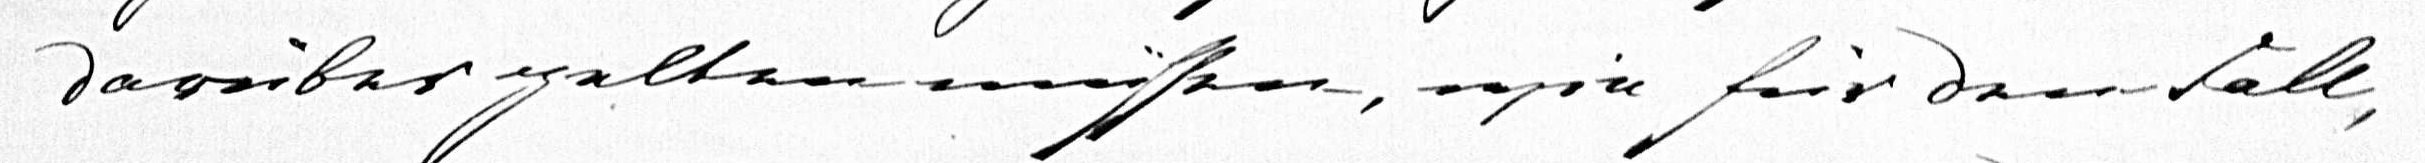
darüber gelten müssen, wie für den Fall,
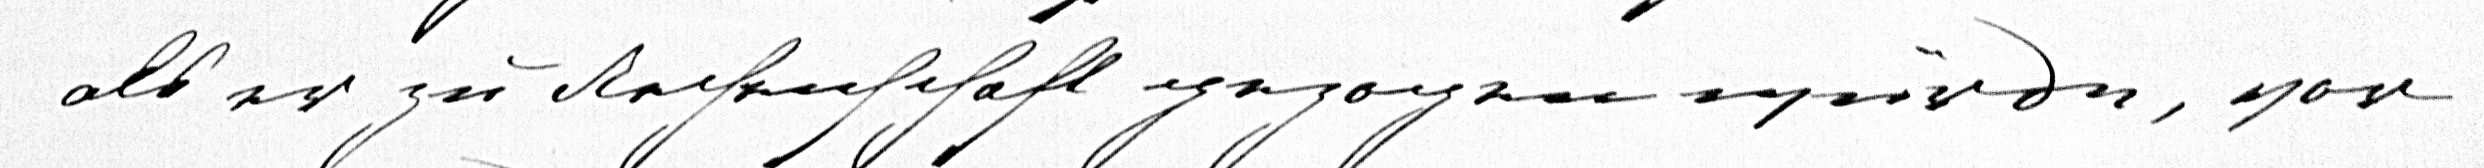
als er zu Rechenschaft gezogen würde, von
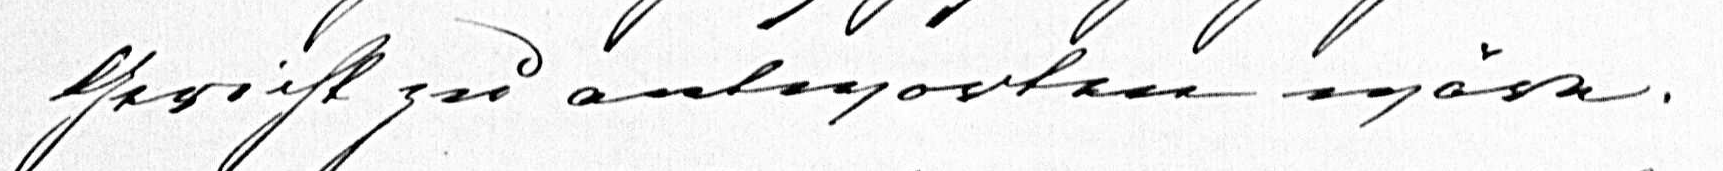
Gericht zu antworten wäre.
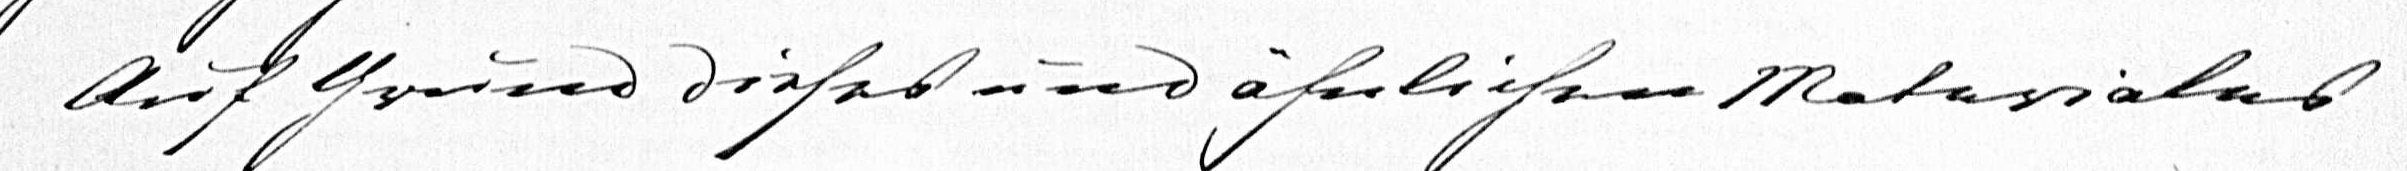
Auf Grund dieses und ähnlichen Materiales
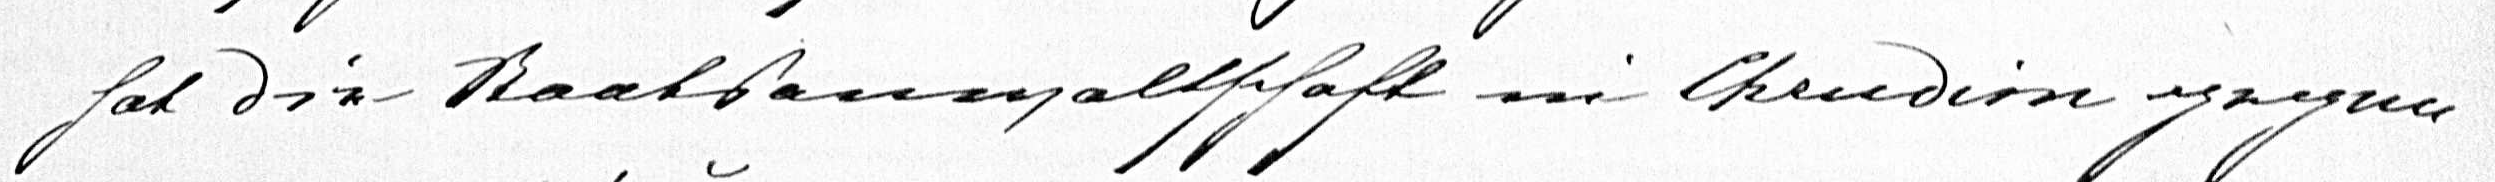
hat die Staatsanwaltschaft in Chrudim gegen
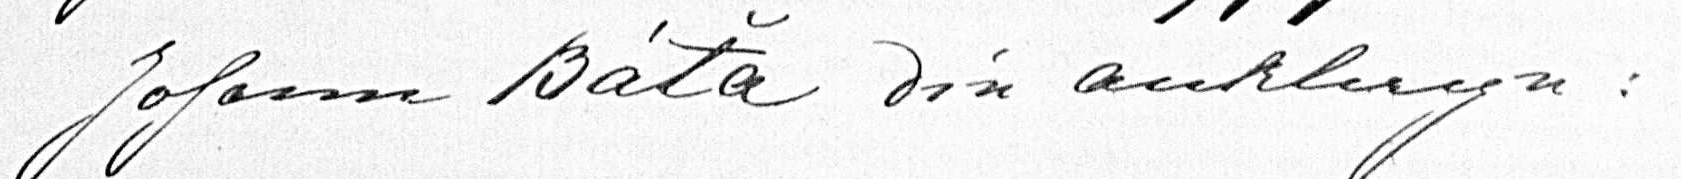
Johann Báta die anklage:
